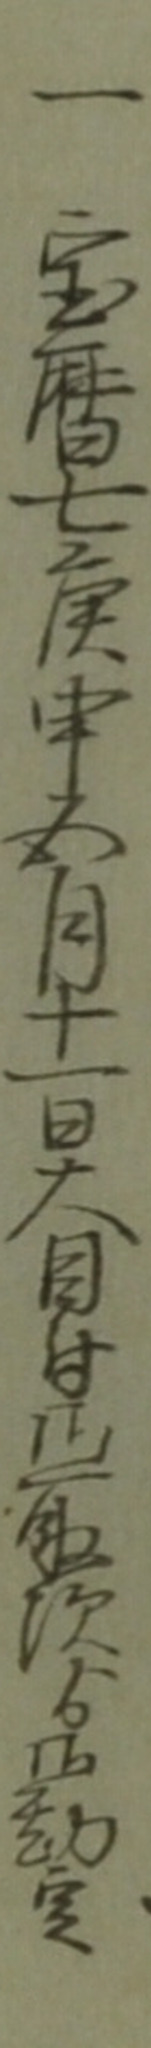一宝暦七庚申五月十一日大目付御取次ゟ御勘定
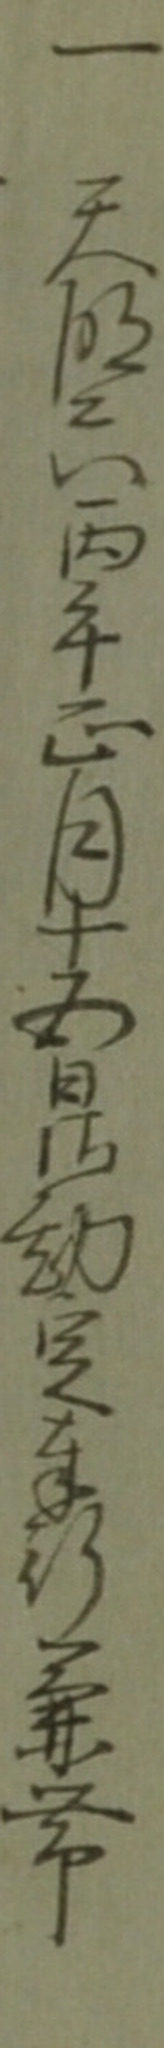一天明六丙午正月十五日御勘定奉行兼帯
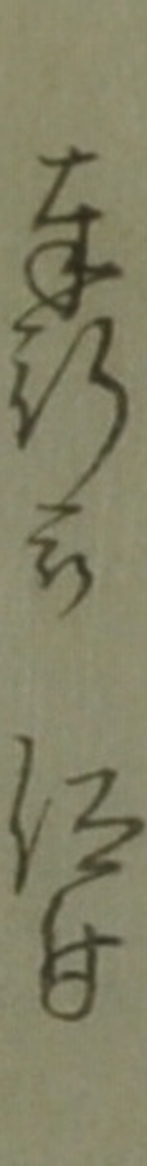奉行被仰付
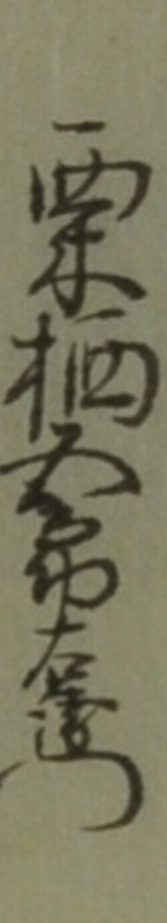栗栖五郎右衛門
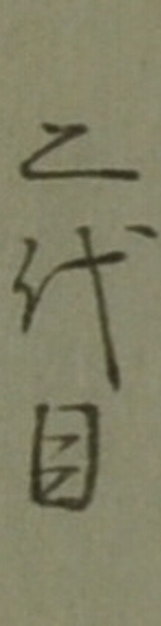二代目
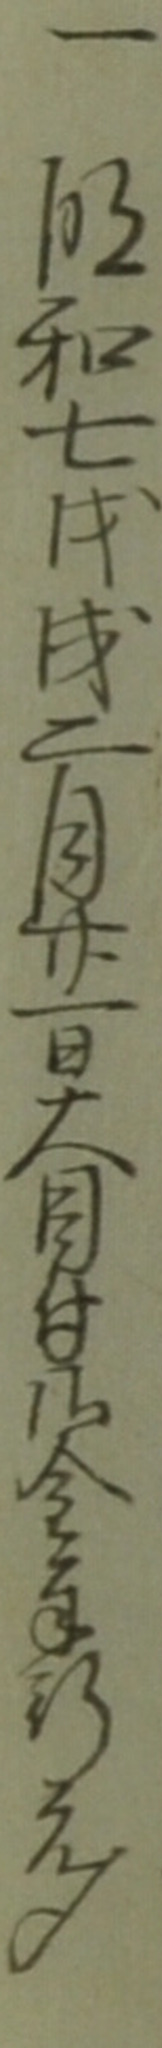一明和七戊戌二月廿一日大目付御金奉行元〆
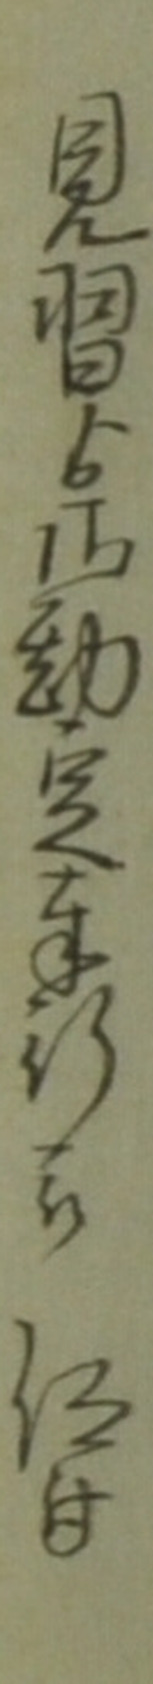見習ゟ御勘定奉行被仰付
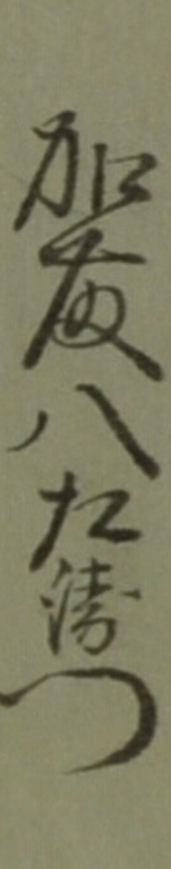加藤八左衛門

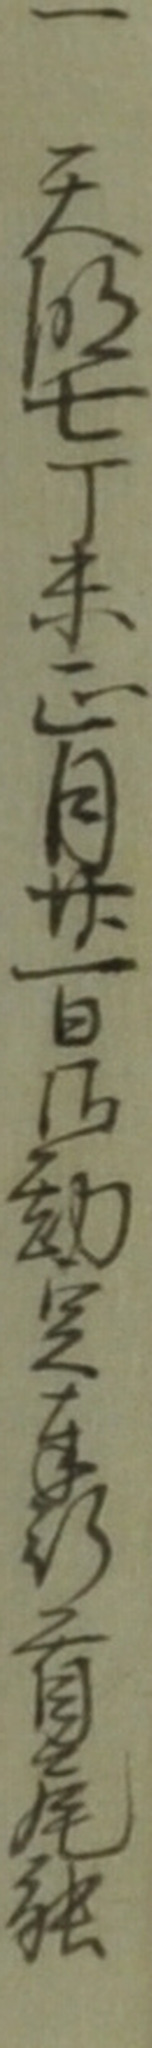一天明七丁未正月廿一日御勘定奉行首尾能
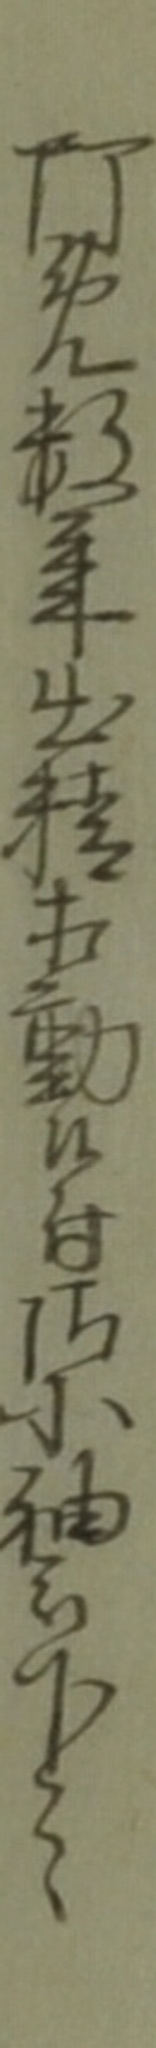御免数年出精相勤候付御小袖被下之
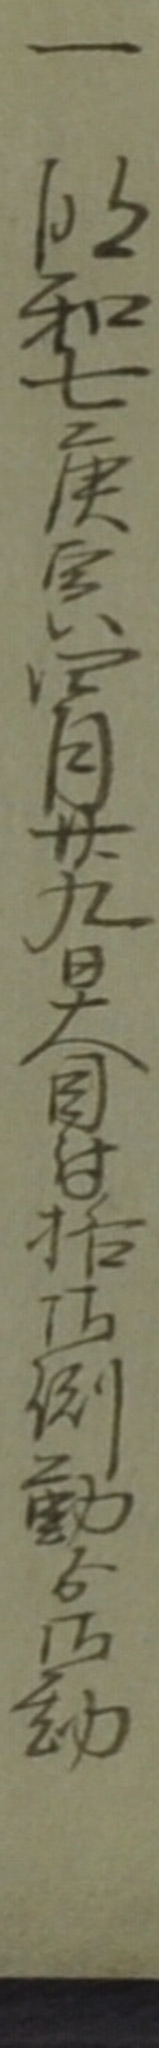一明和七庚寅四月廿九日大目付格御側勤ゟ御勘
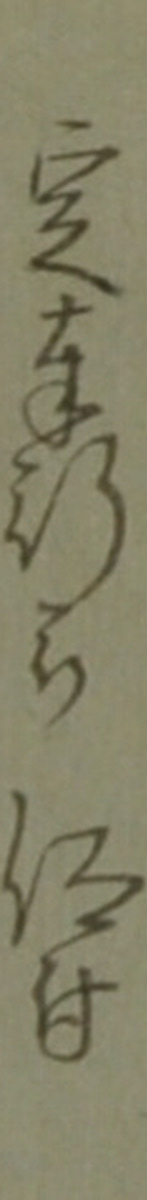定奉行被仰付
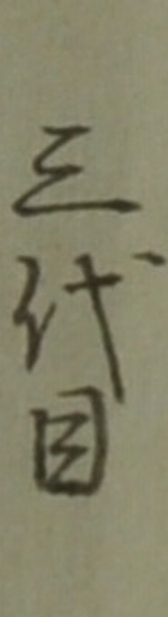三代目
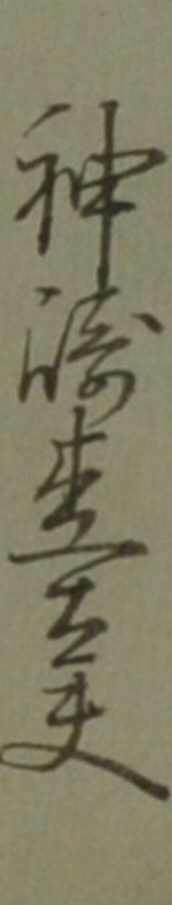神崎杢太夫
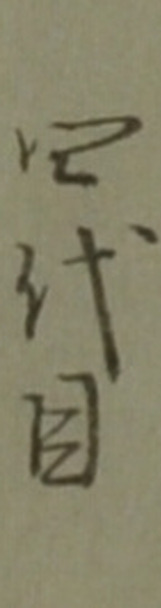四代目
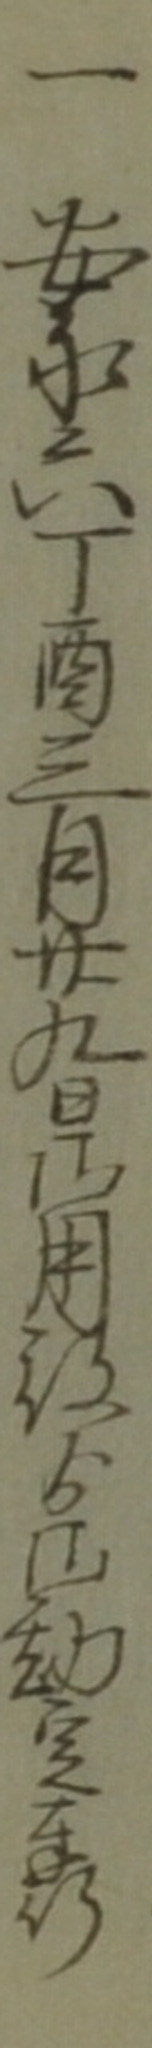一安永六丁酉三月廿九日御用役ゟ御勘定奉行
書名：諸御役代々録（三）
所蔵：伊那市立高遠町図書館・合同会社AMANE
